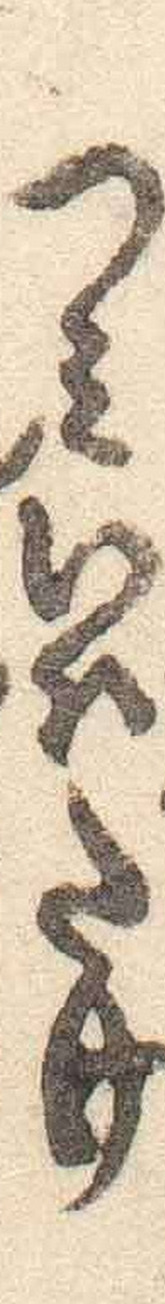つみいはたけ
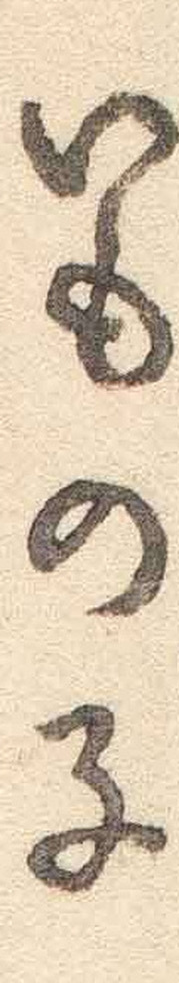いもの子
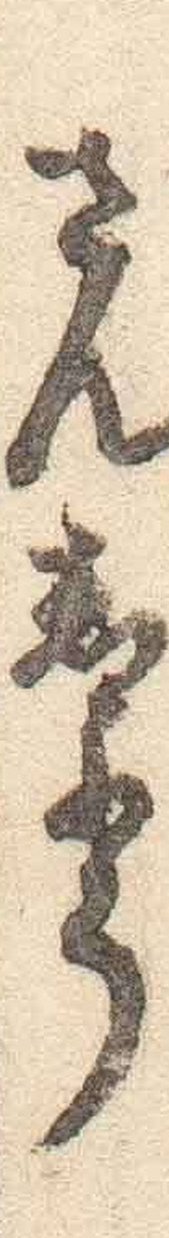さんしよう
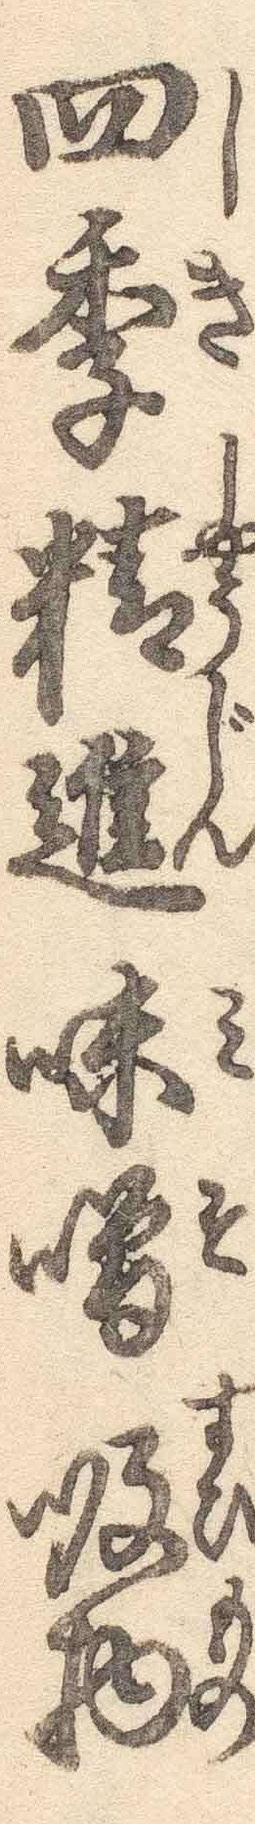四季精進味噌吸物
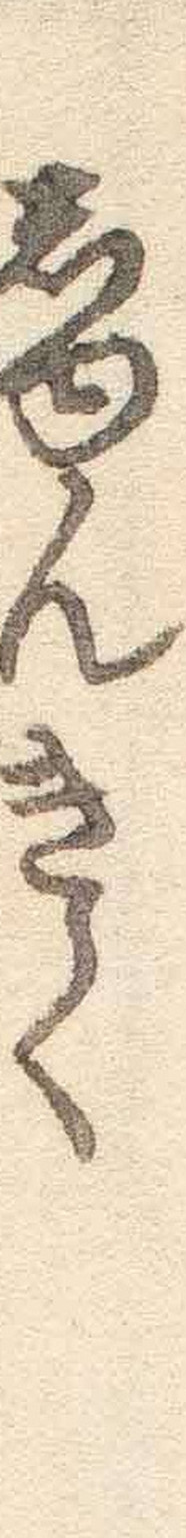しゆんきく
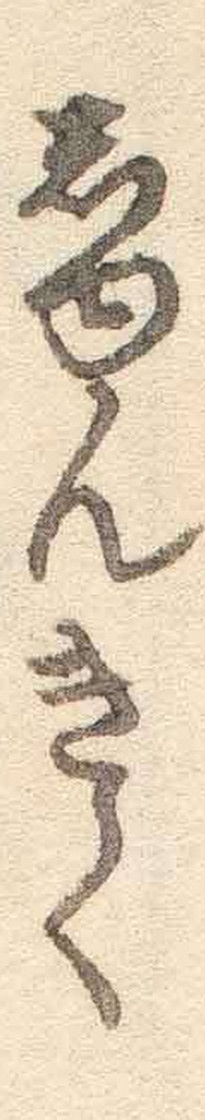しゆんきく
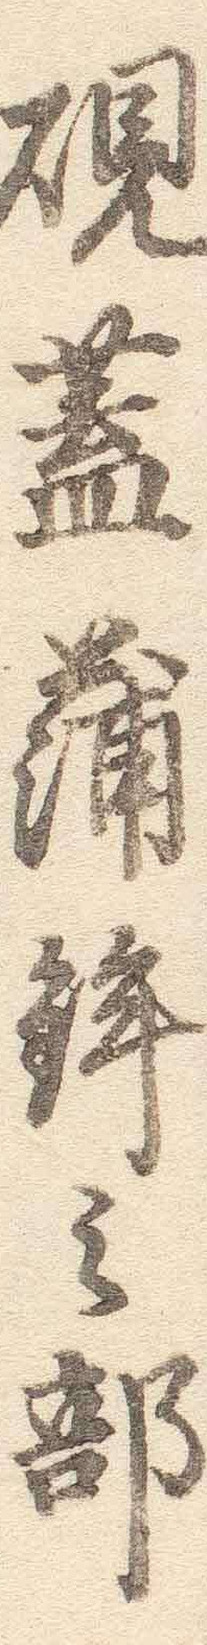硯蓋蒲鉾之部
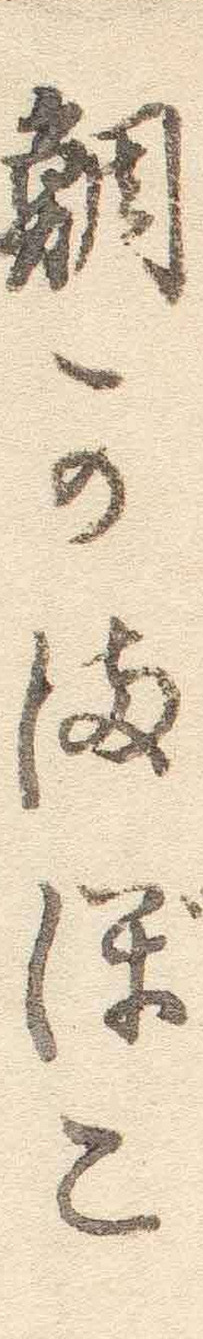鰆かまぼこ
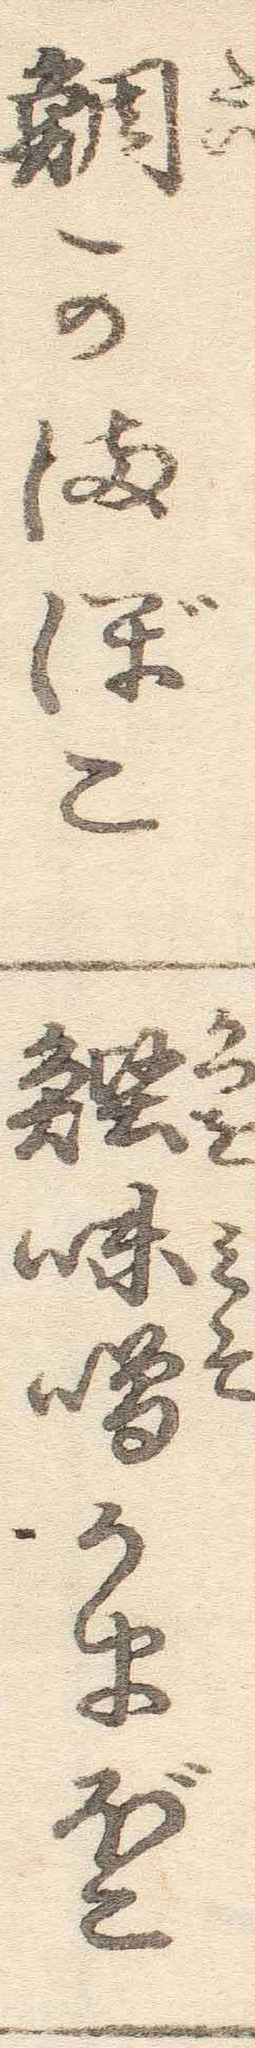鯛かまぼこ鰹味噌かまぼこ
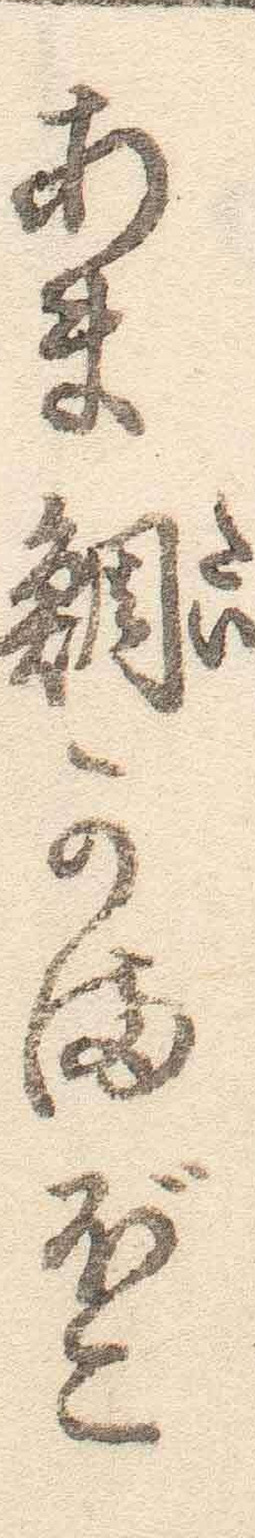あま鯛かまぼこ
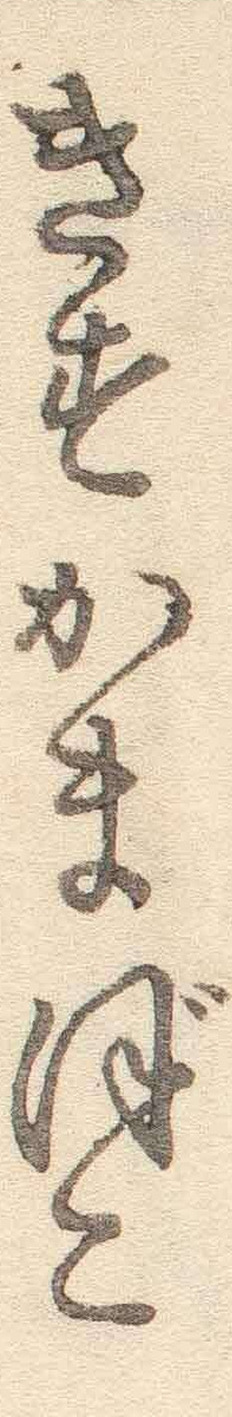鰆かまぼこ
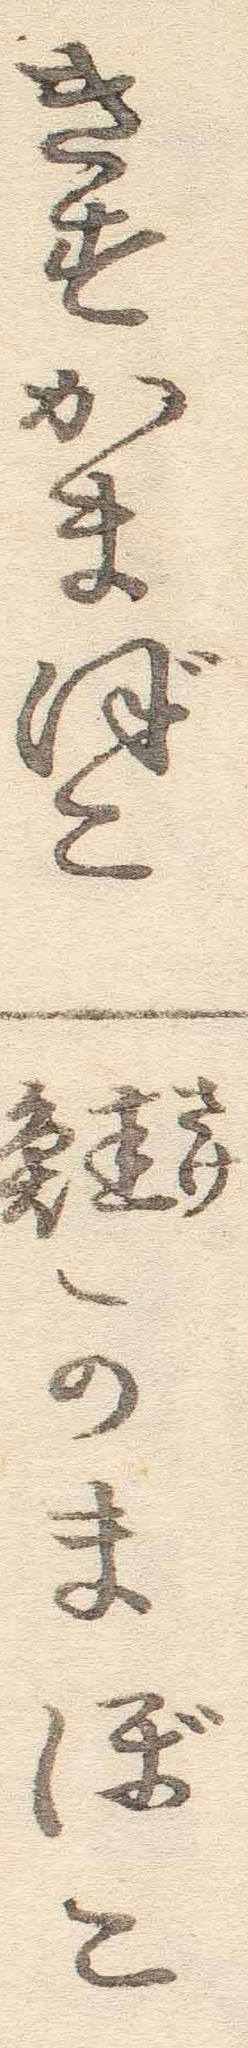きすかまぼこ鮭かまぼこ
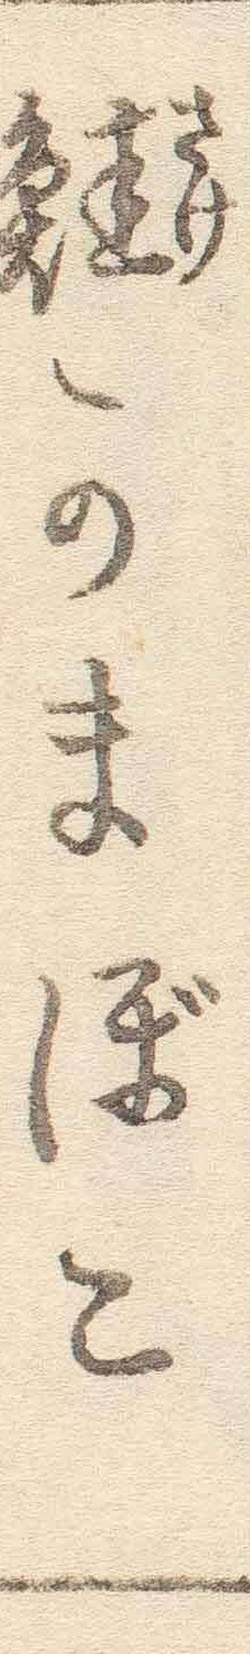鰆かまぼこ
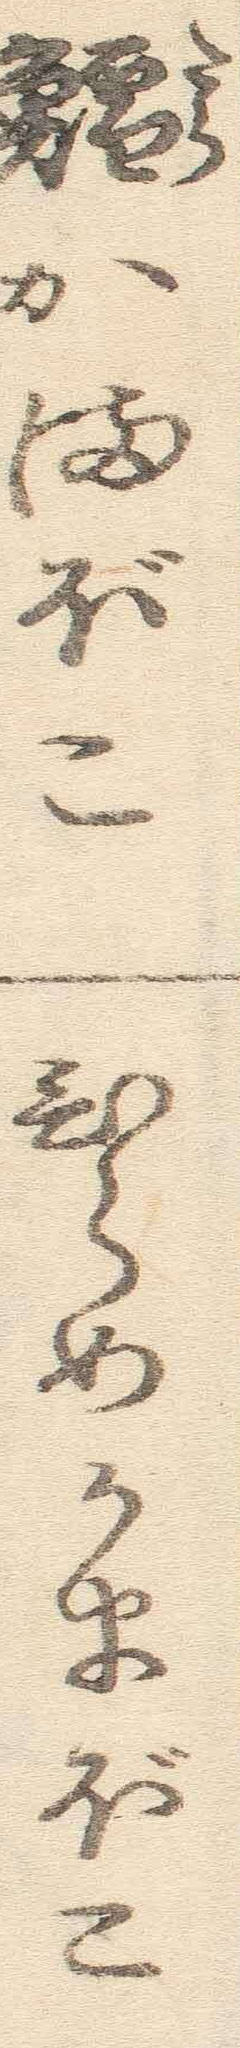鱈かまぼこひらめかまぼこ
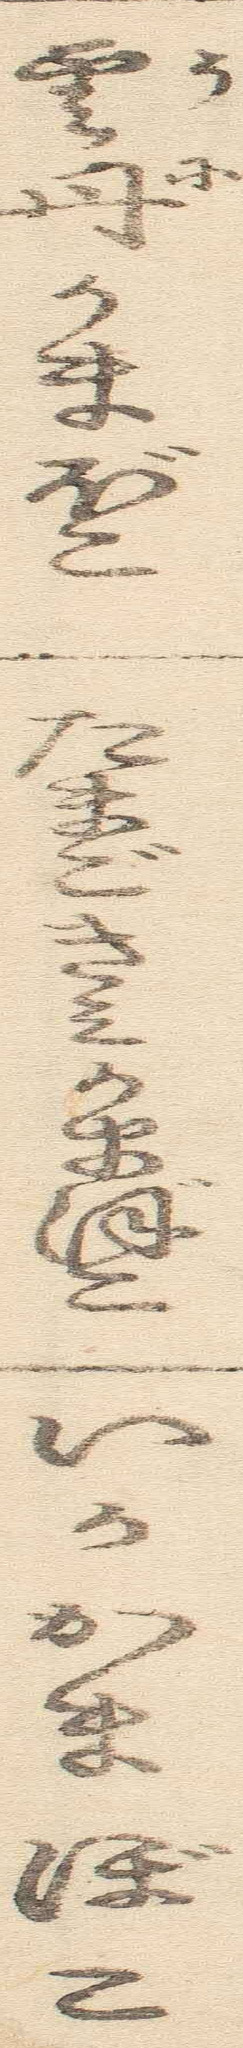雲丹かまぼこたまごきみかまぼこ
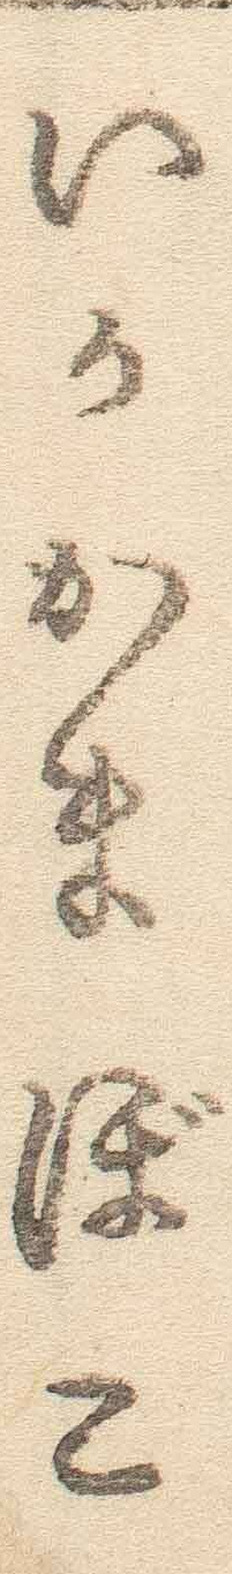いかかまぼこ
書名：料理通
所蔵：東京学芸大学附属図書館 国文学研究資料館
